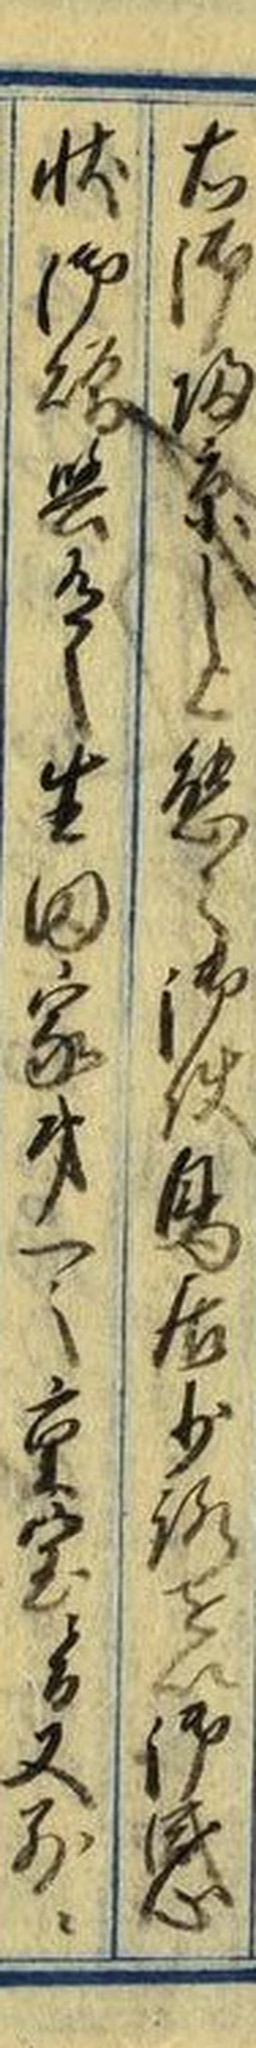状御贈与有之生田家第一之重宝に而又別に
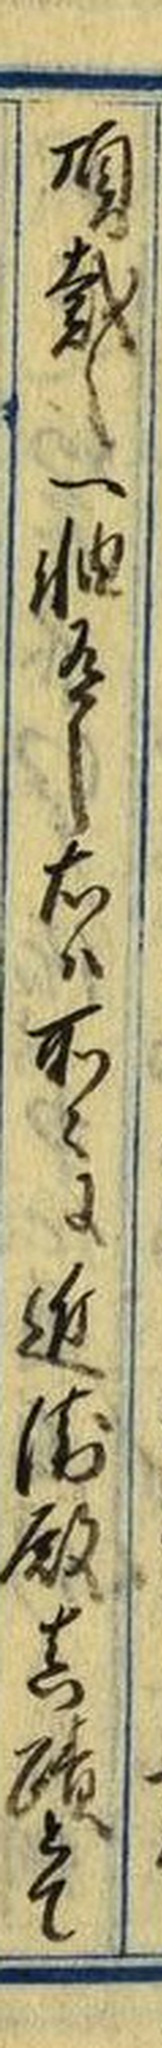頂戴之一軸有之右は所々に近衛殿真蹟とて
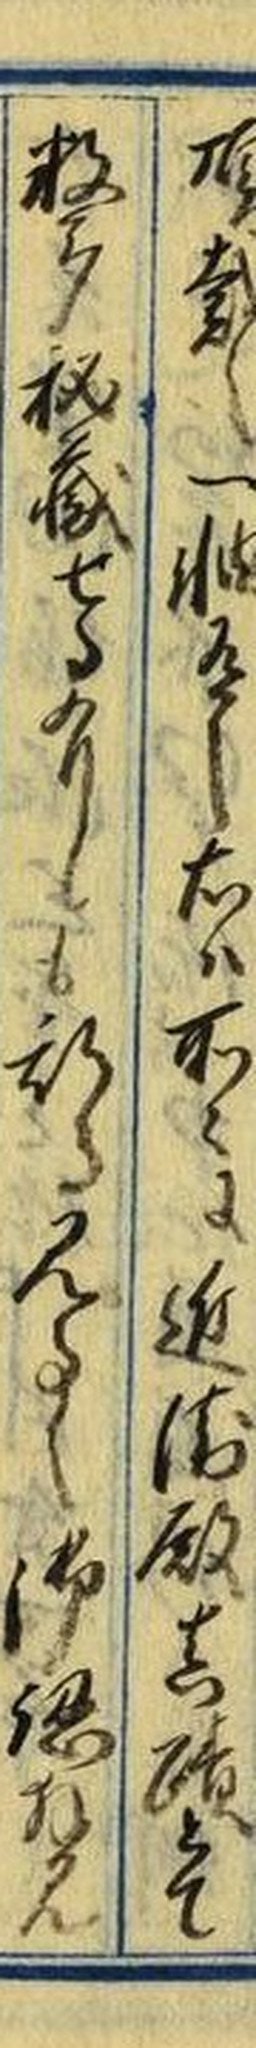数多秘蔵せる有しも斯る見事之御認拝見
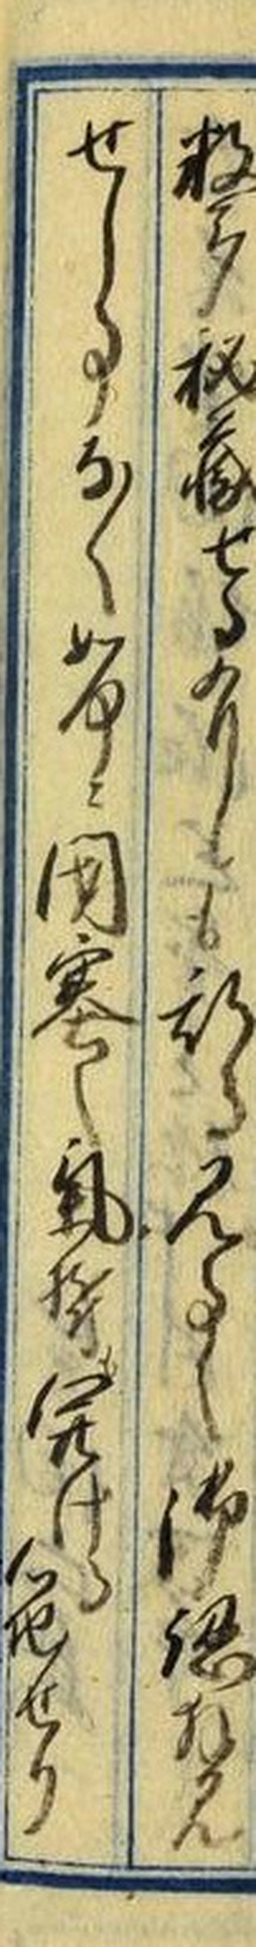せし事なく如何に閉塞之気持も開ける心地せり
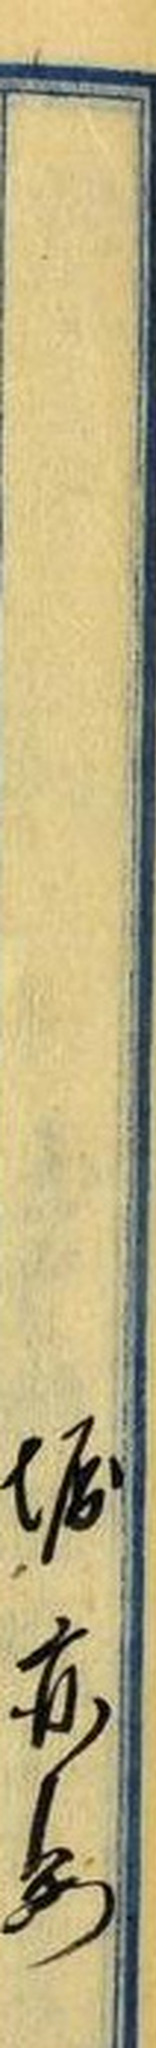堀亦右衛門
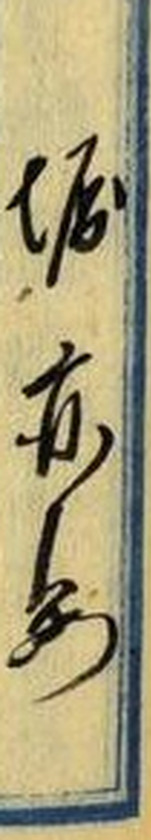堀亦右衛門
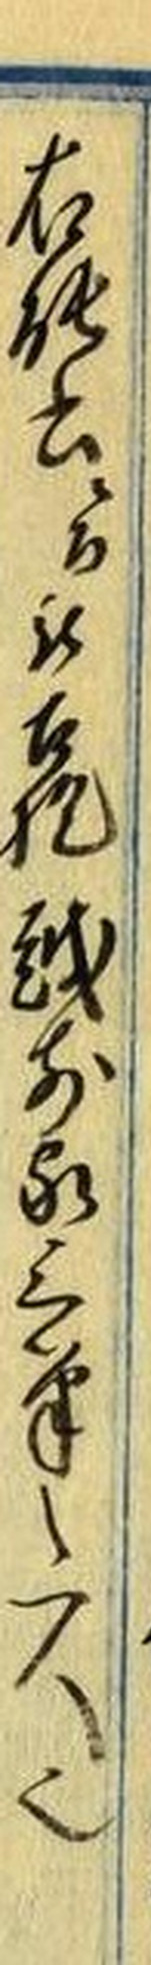右能書に而被召抱越前家三筆之一人也
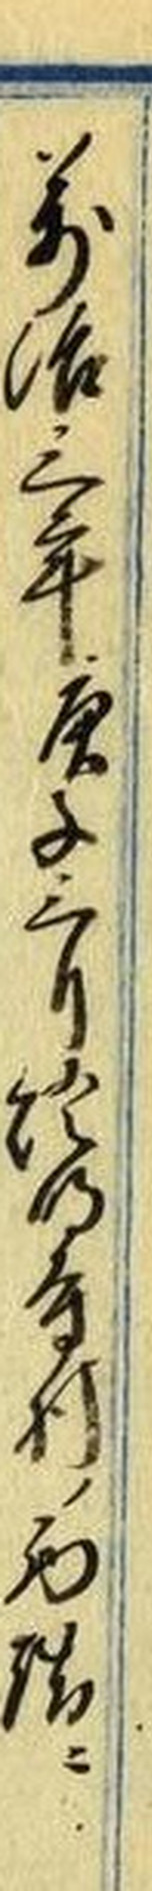万治三年庚子三月燈明寺村ノ西詰に
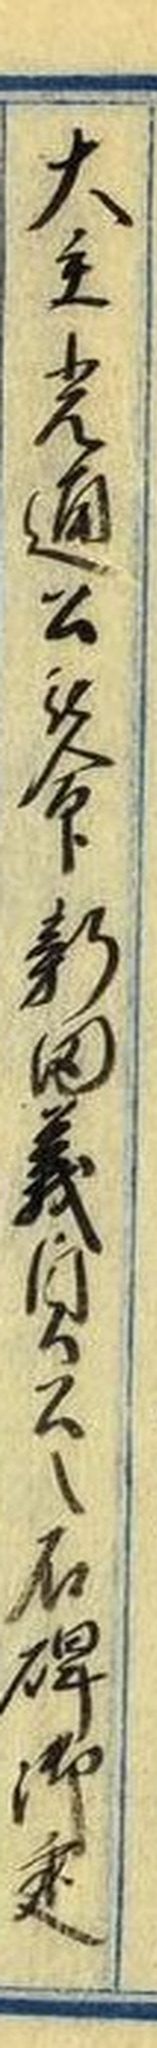大主光通公被命新田義貞公之石碑御建
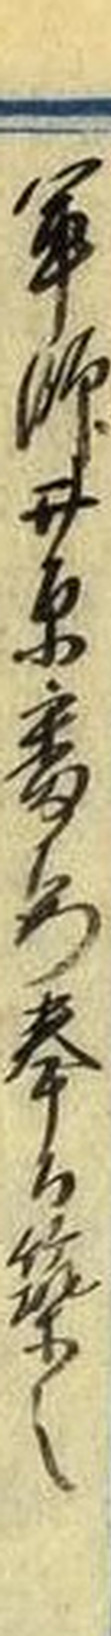軍師井原番右衛門奉而築之
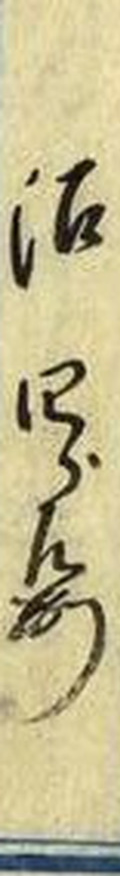沼四郎左衛門
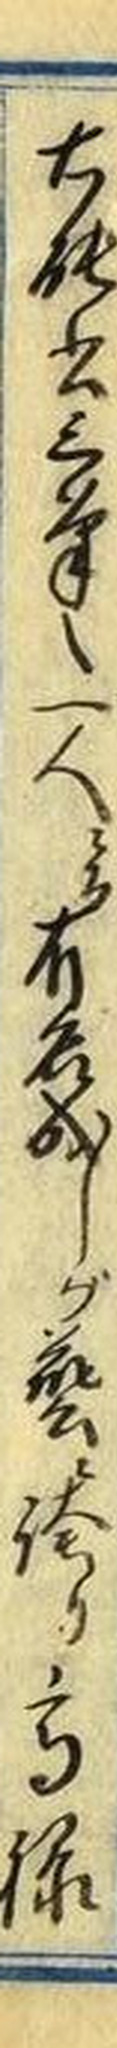右能書三筆之一人に而有名成しが芸に誇り高禄
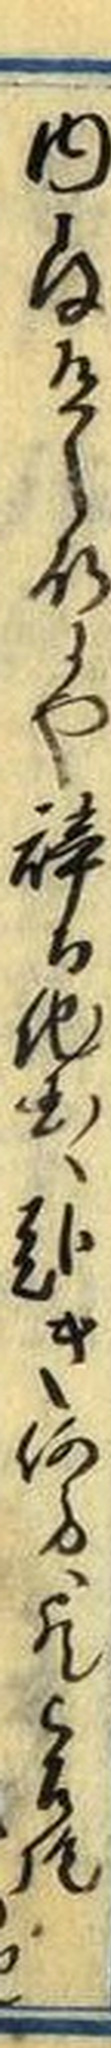内存有之故にや辞而他国に赴き何方へか被召抱たる由

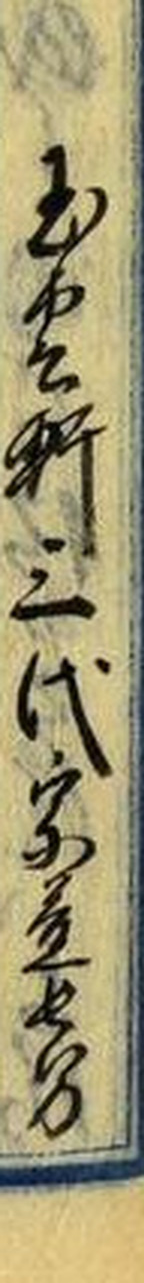玉雲軒三代宗益長男
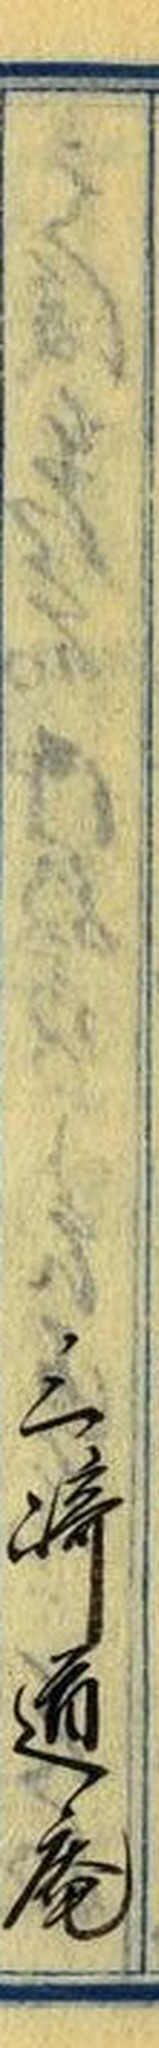三崎道庵
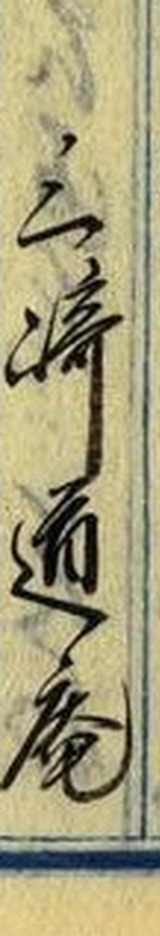三崎道庵
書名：温古集 四巻
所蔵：福井県文書館 Fukui Prefectural Archives
